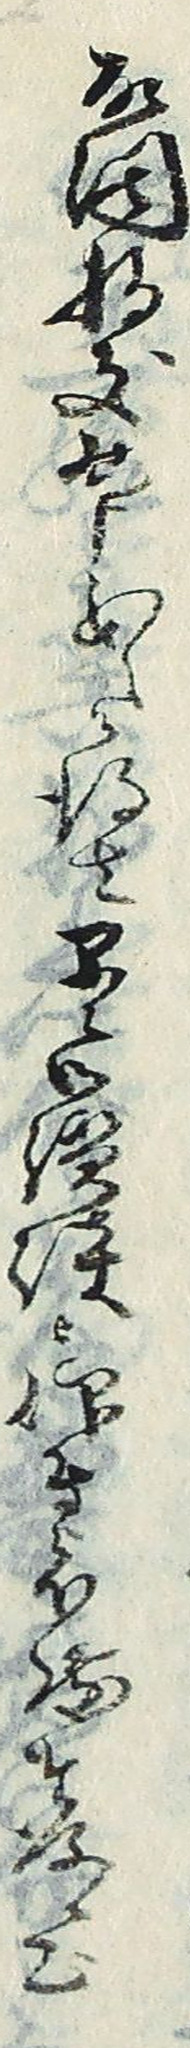取調指支居申義候得者早々御讃談被仰付被下度奉存候以上
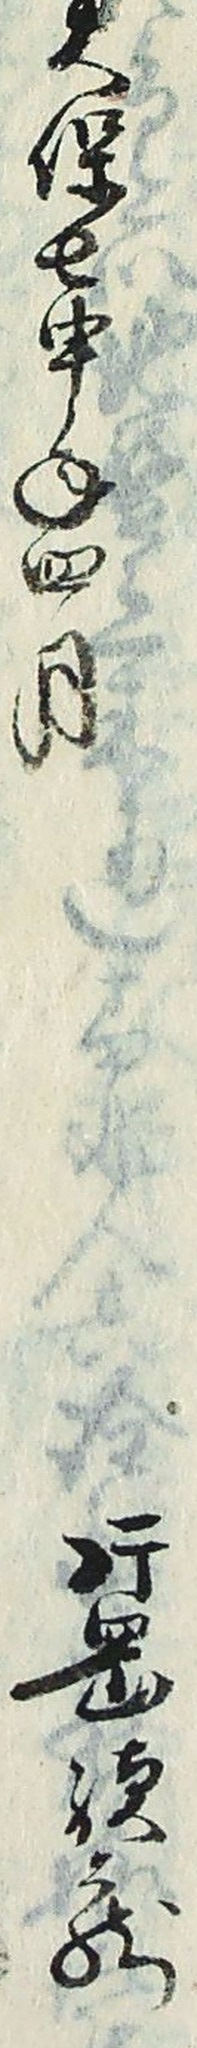天保七申年四月片岡續蔵
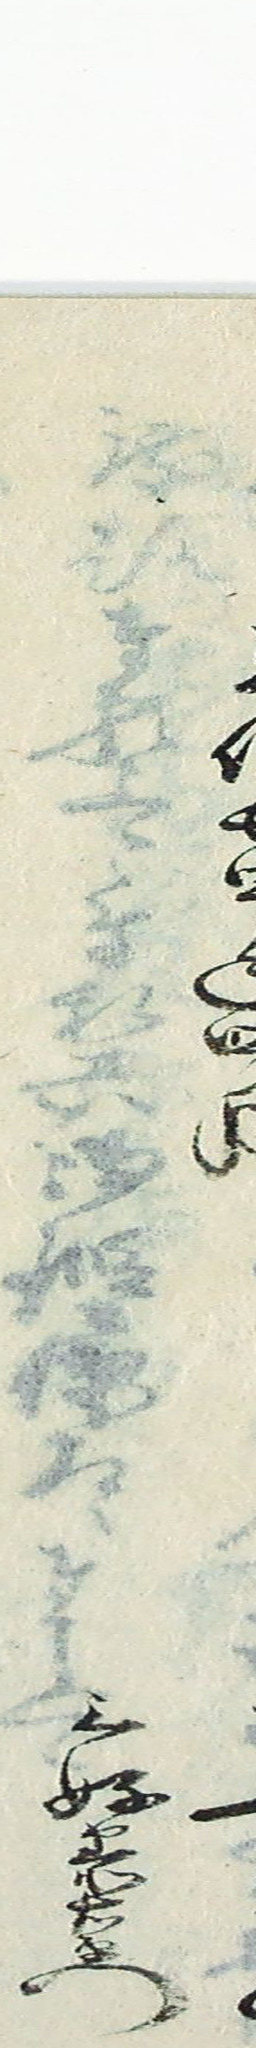三好泰右衛門
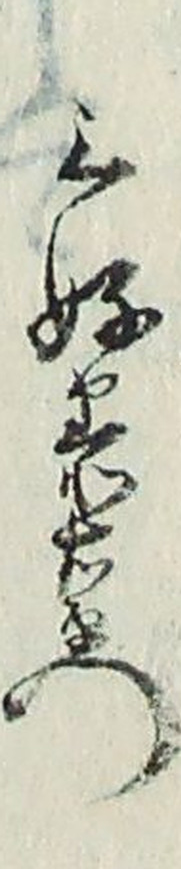三好泰右衛門
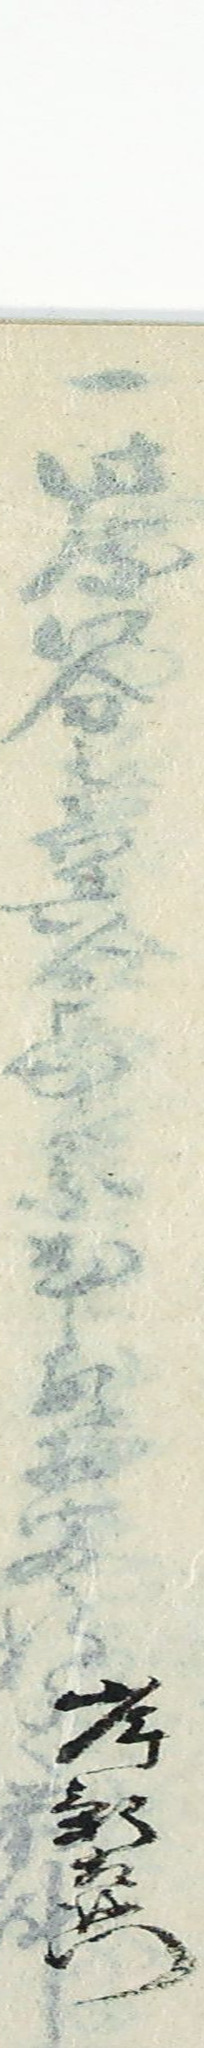岸新左衛門
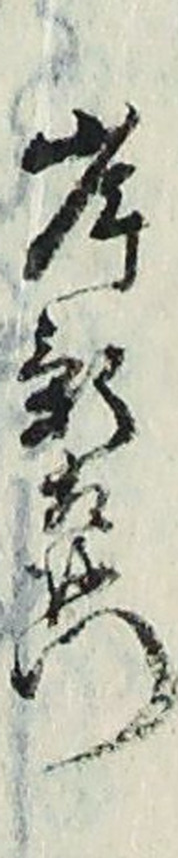岸新左衛門
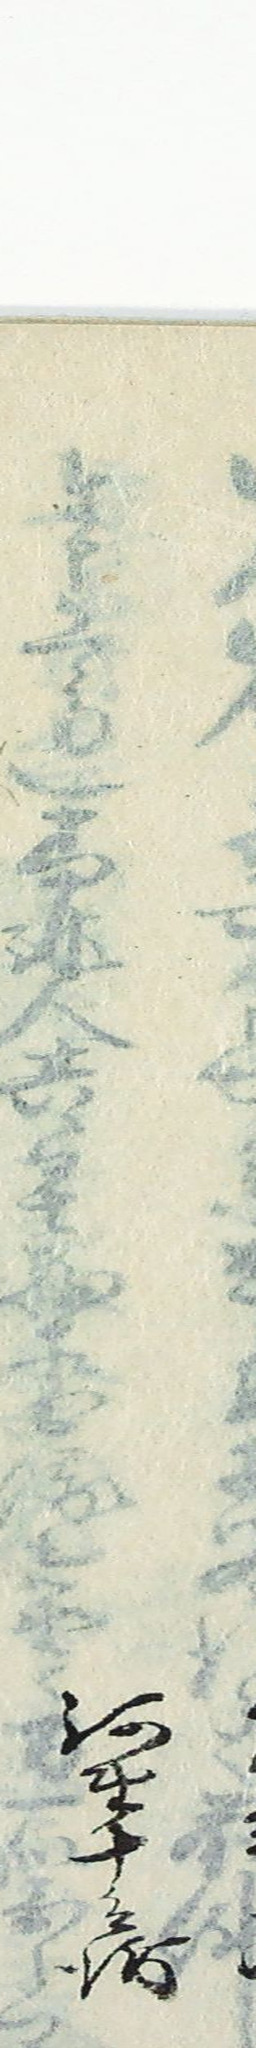河野十兵衛
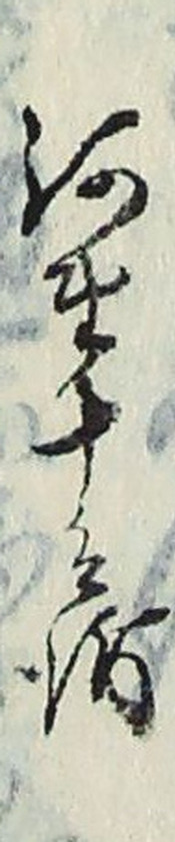河野十兵衛
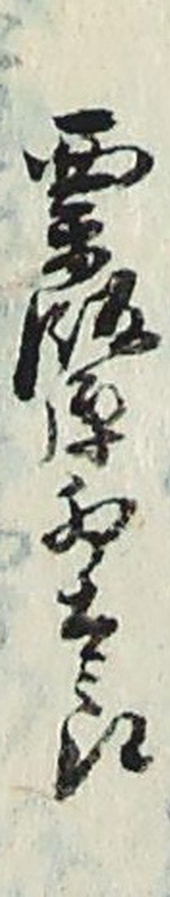粟飯原卯太郎
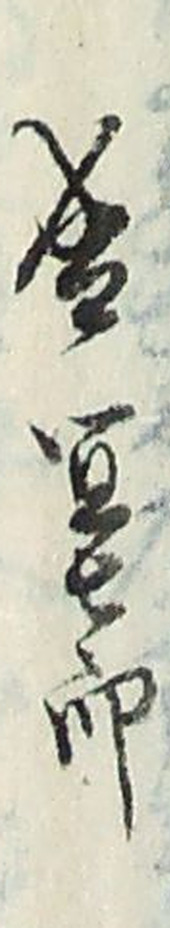盛宣七郎
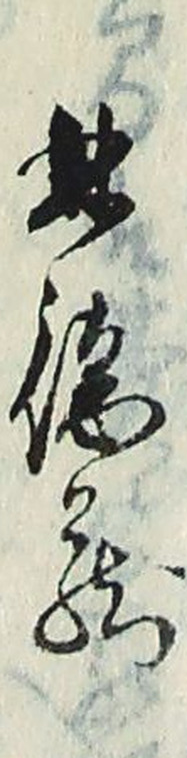林徳蔵
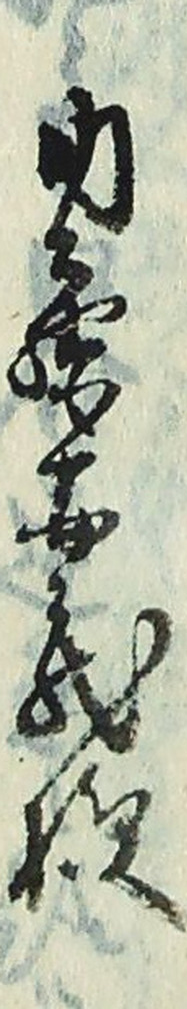内藤安蔵殿
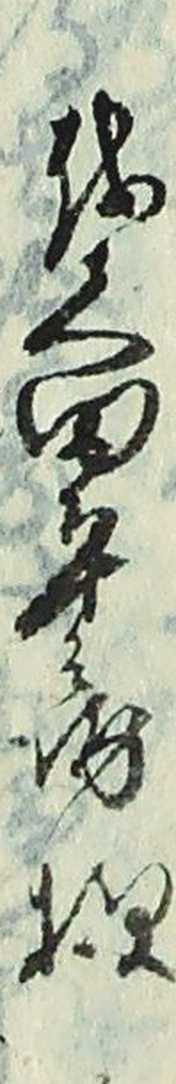佐久田平兵衛殿
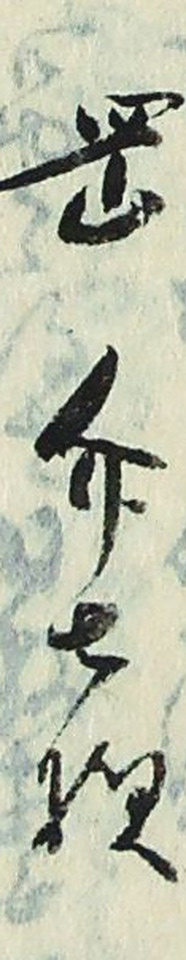岡介七殿
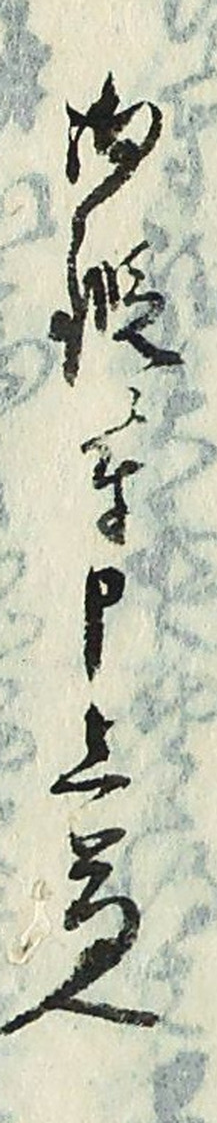御鍛ニ付申上覚
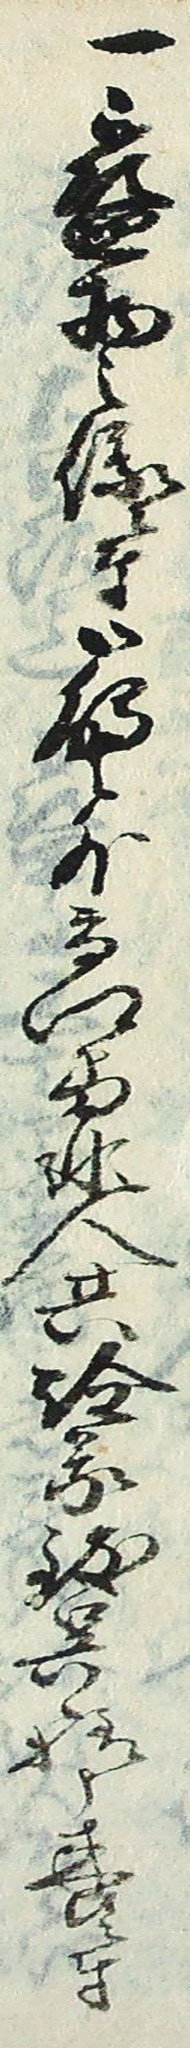一被盗物之儀ニ付御觸候外市郷番非人共詮義致呉候様申来候ニ付
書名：市郷質屋株御取究並御書出御趣法之写
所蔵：鳴門教育大学 Naruto University of Education
